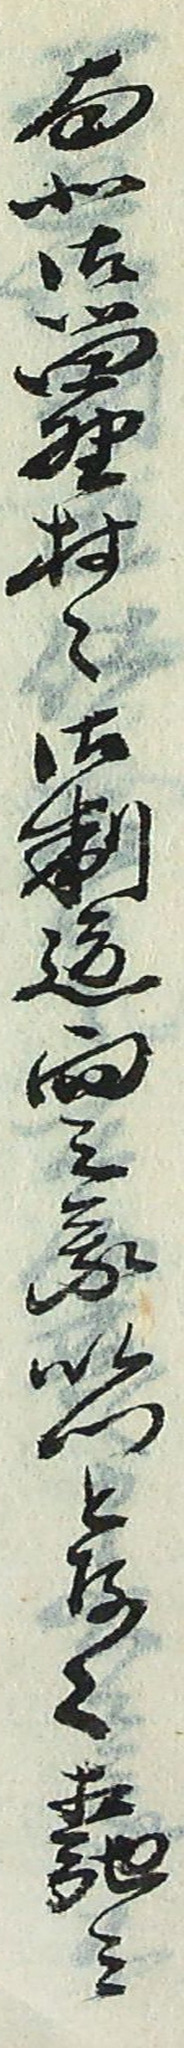南北御留野村々御制道向之義いつとなく相弛ミ
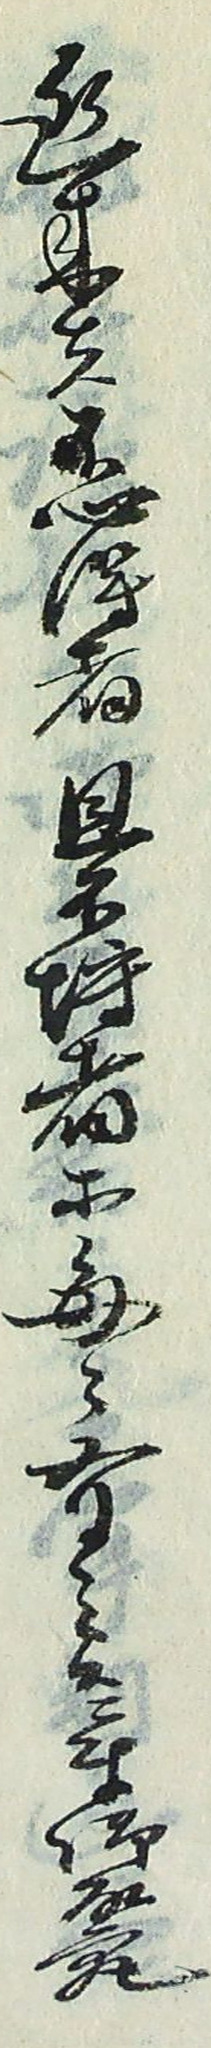近来者不心得者且不埒者等毎々有之候ニ付御取究
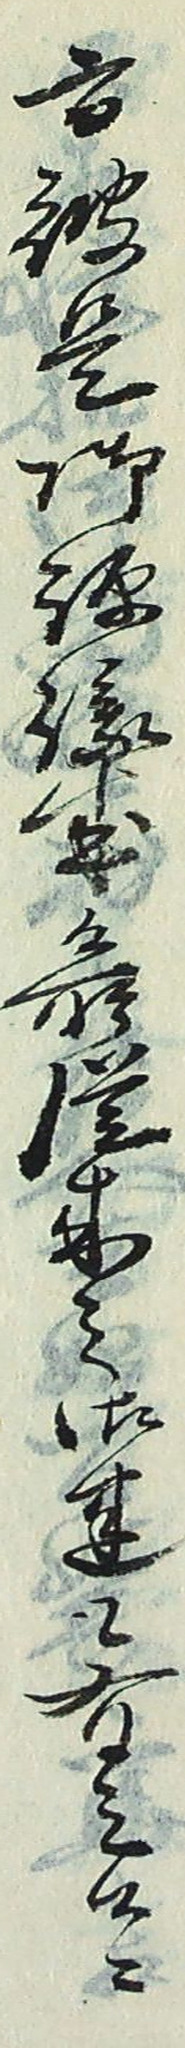旨彼是御評儀成候所従来之御達も有之候ニ
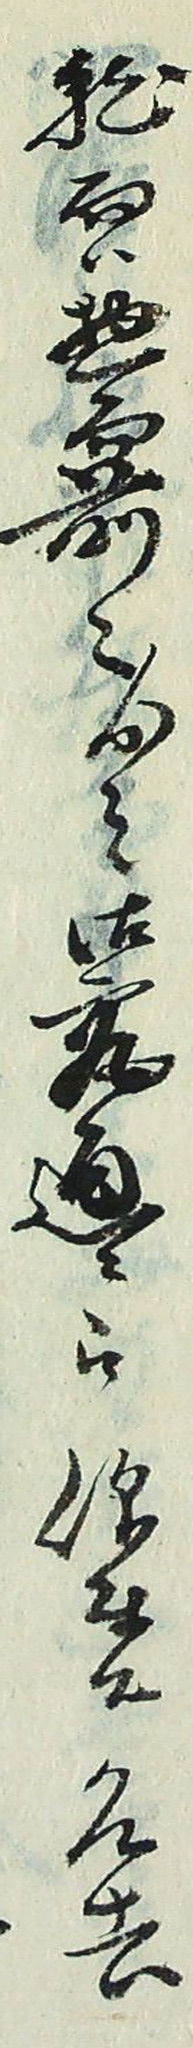就而ハ惣而前々ゟ之御究通ニ被仰付候乍去
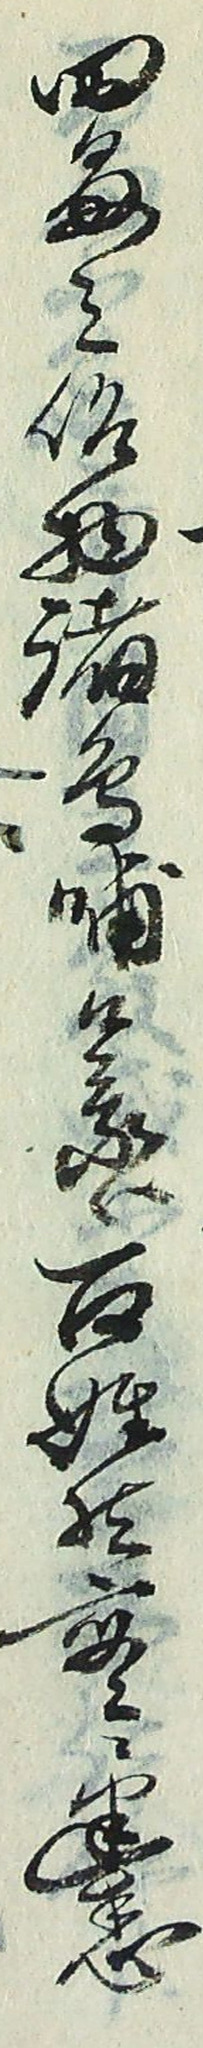田畠之作物諸鳥哺候義ハ百姓共實ニ迷惑
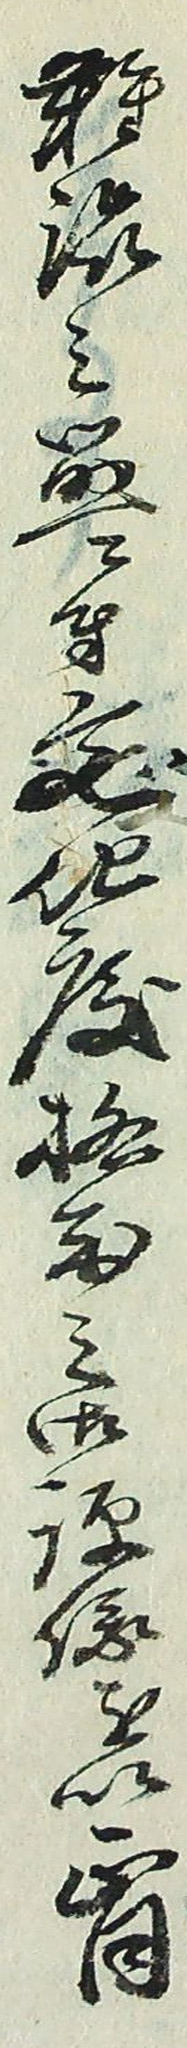難渋之筋ニ付文化度格別之御評儀を以正月
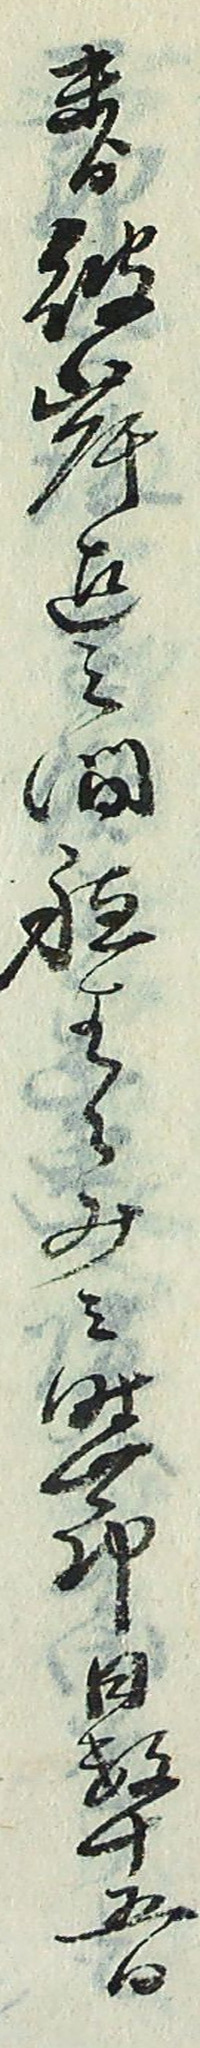末ゟ彼岸迄之間穂はらみ之時節日数十五日
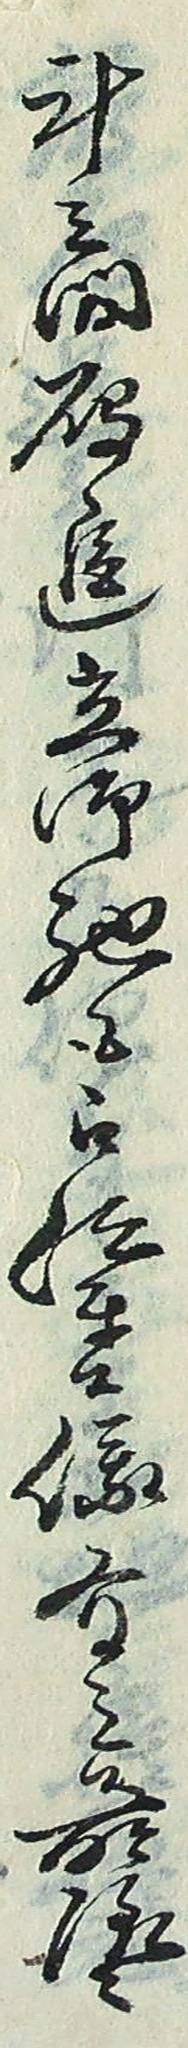斗之間鴈追立御弛も被仰付候儀有之候所様々
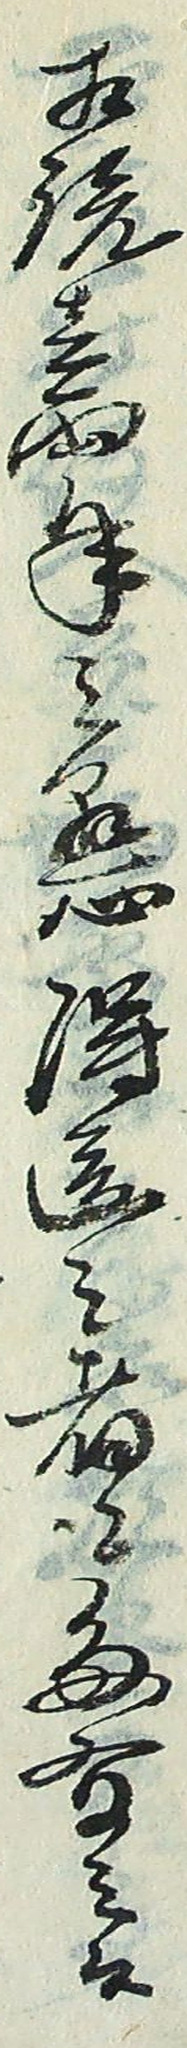相流壱両年之懸心得違之者も多有之候
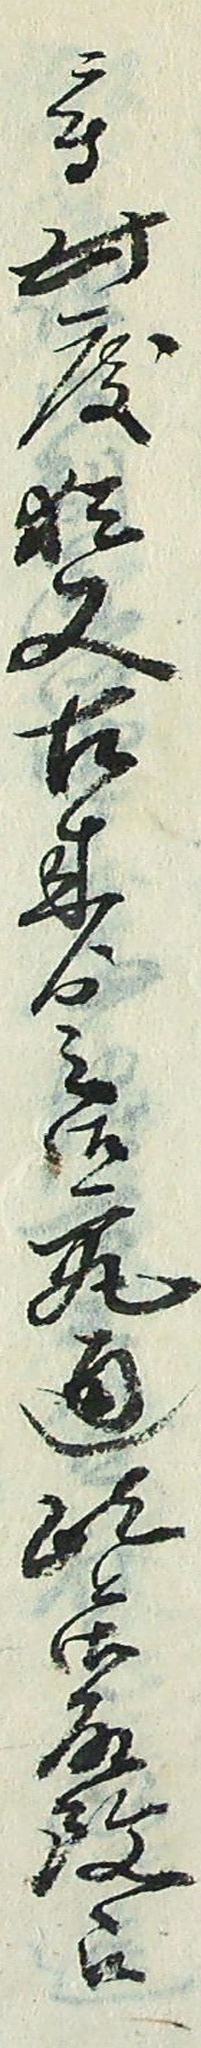ニ付此度猶又古来ゟ之御究通屹と御取改被
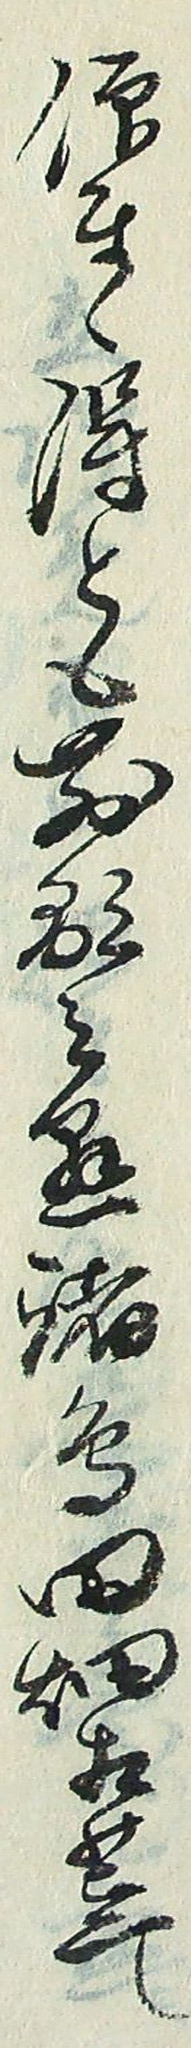仰付候得とも前顕之懸諸鳥田畑相荒し

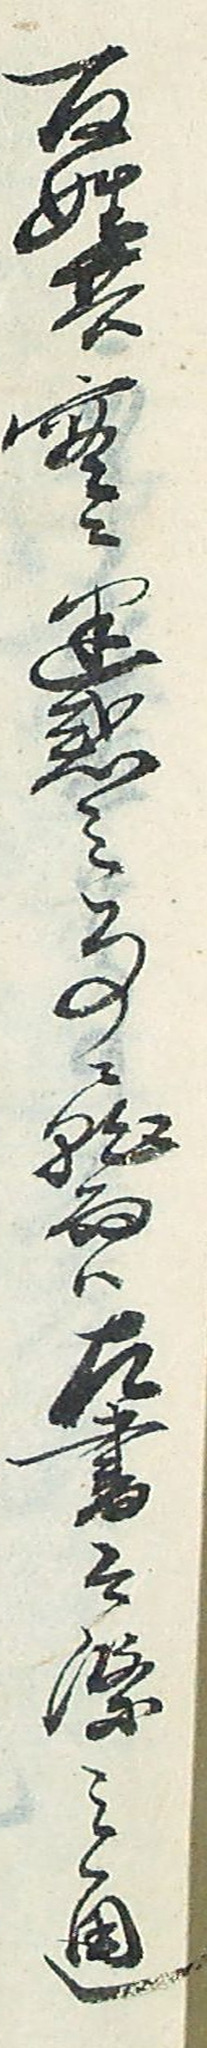百姓共實ニ迷惑之事ニ就而ハ左書ケ條之通
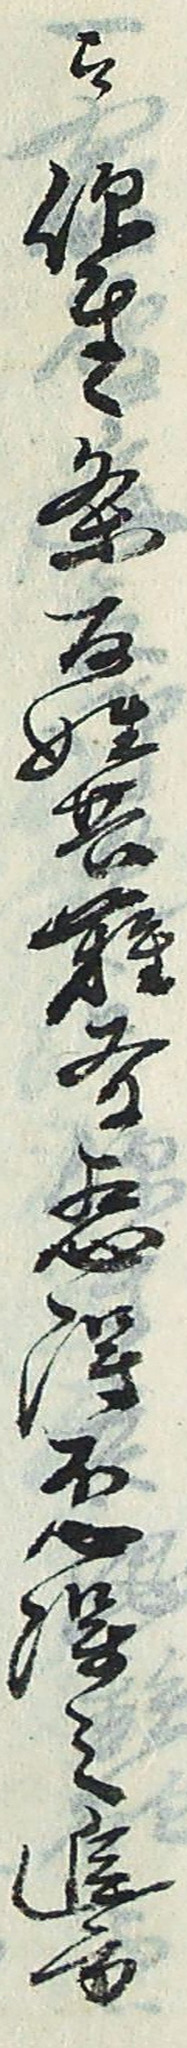被仰付候条百姓共難有相心得不心得之追方
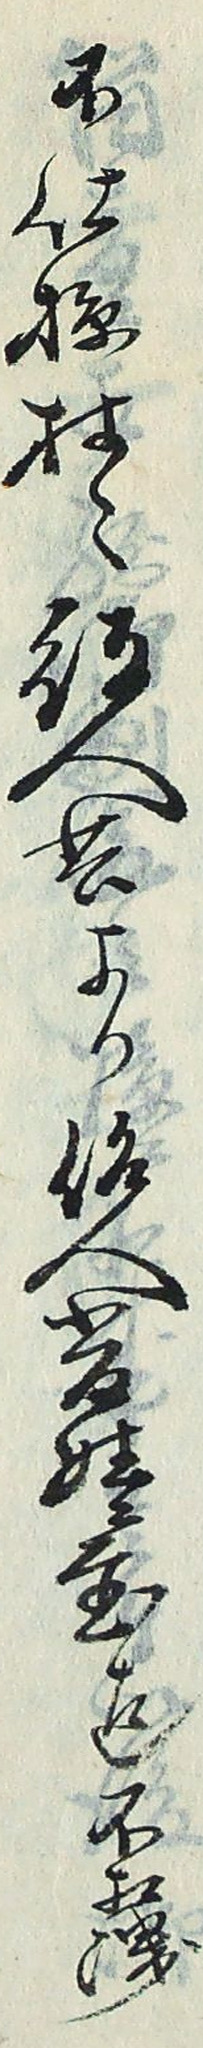不仕様村々役人共より作人小百姓ニ至迄不相洩
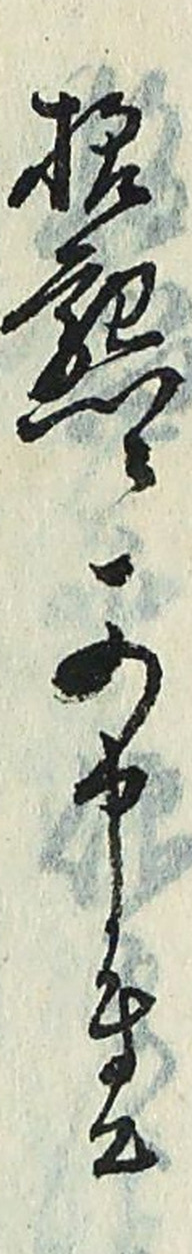様懇ニ可申付候
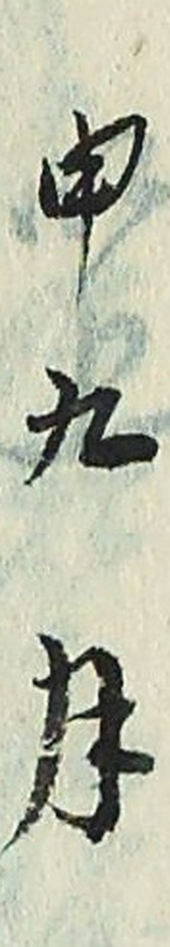申九月
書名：諸御趣意書并御下知向之写
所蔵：鳴門教育大学 Naruto University of Education
